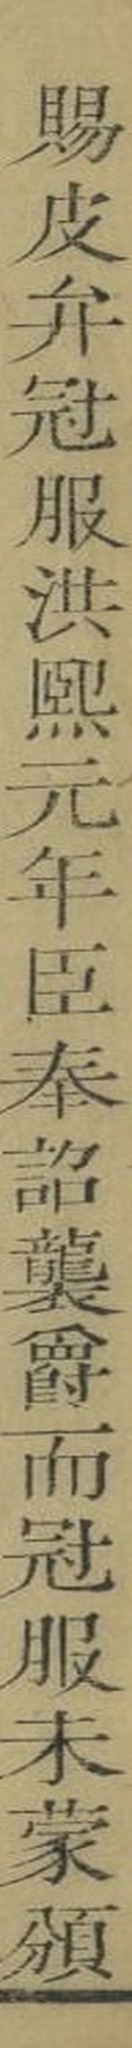賜皮弁冠服洪熙元年臣奉詔襲爵而冠服未蒙頒
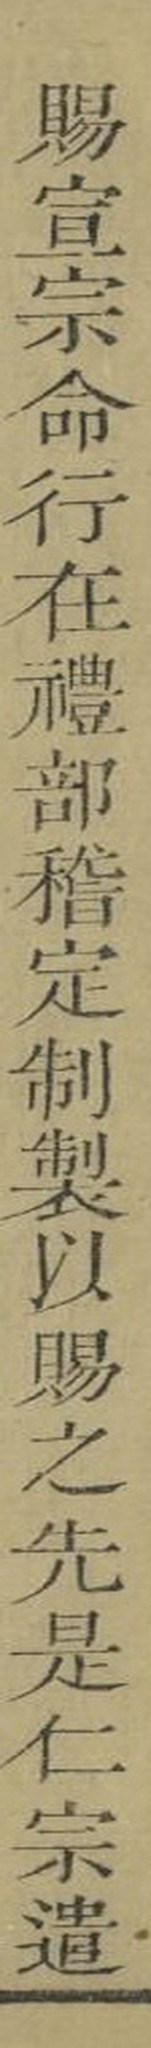賜宣宗命行在礼部稽定制製以賜之先是仁宗遣
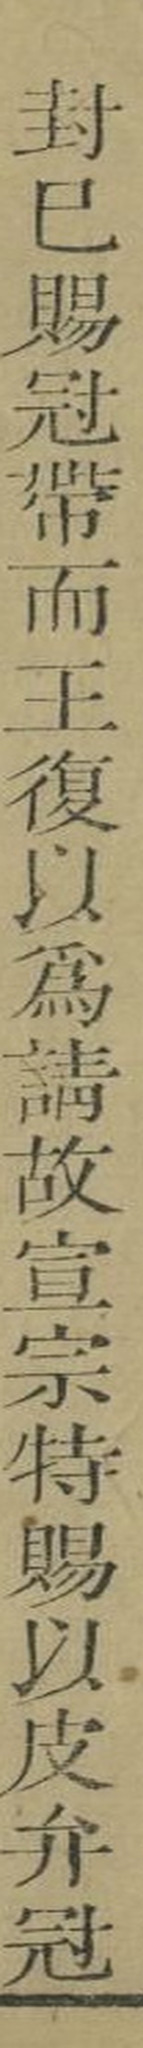封巳賜冠帯而王復以為請故宣宗特賜以皮弁冠
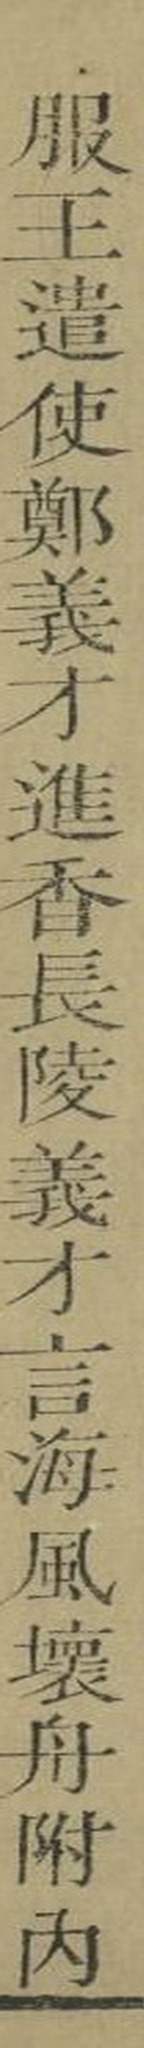服王遣使鄭義才進香長陵義才言海風壊舟附内
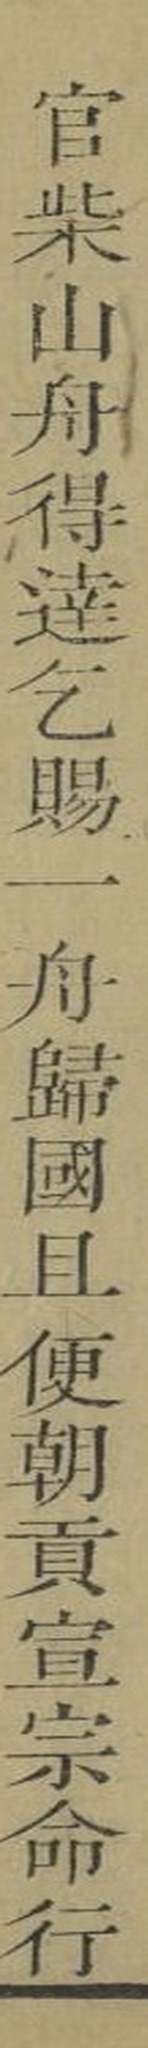官柴山舟得達乞賜一舟帰国且便朝貢宣宗命行
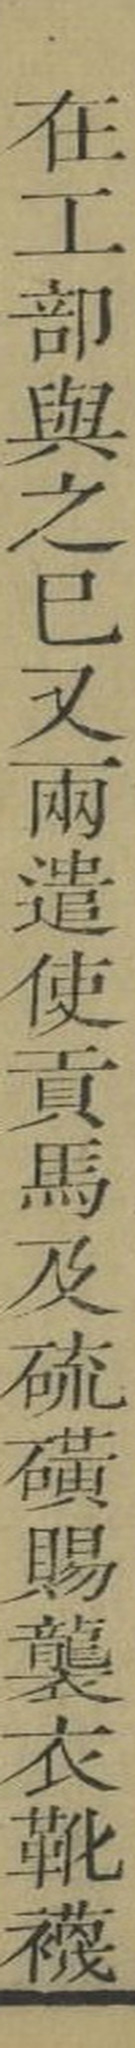在工部与之巳又両遣使貢馬及硫磺賜襲衣靴襪
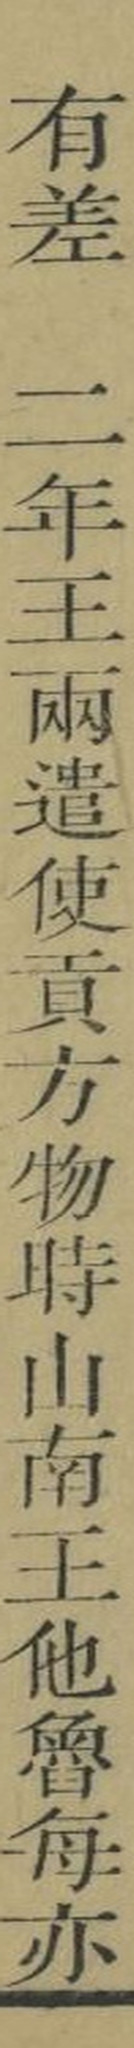有差二年王両遣使貢方物時山南王他魯毎亦
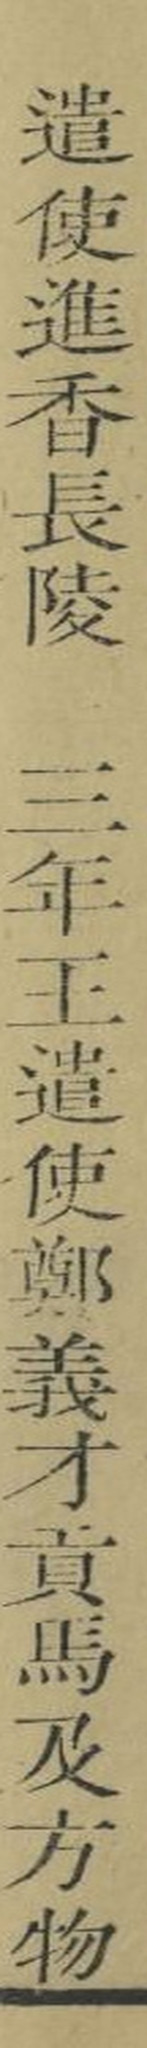遣使進香長陵三年王遣使鄭義才貢馬及方物
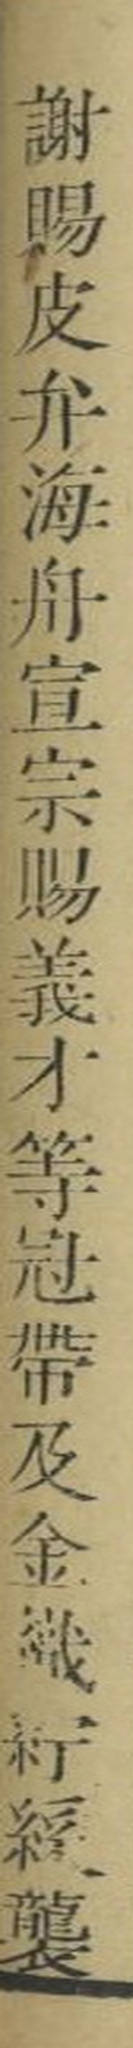謝賜皮弁海舟宣宗賜義才等冠帯及金織紵糸襲
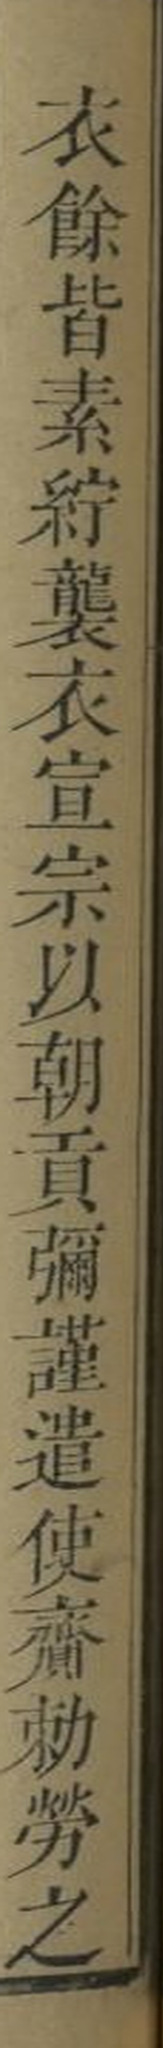衣余皆素紵襲衣宣宗以朝貢弥謹遣使齎勅労之
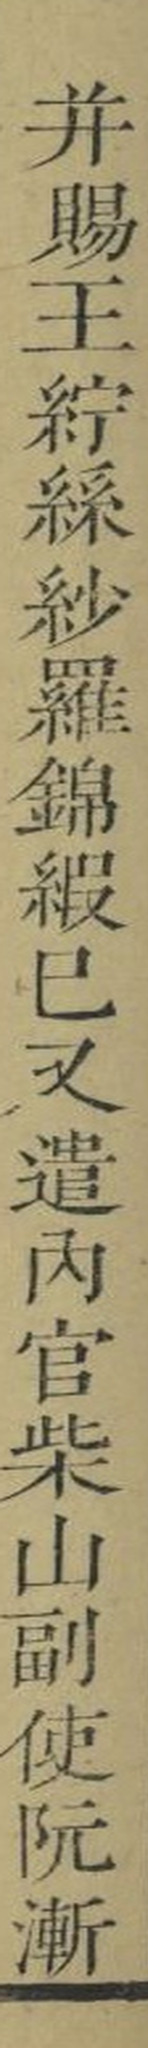并賜王紵糸紗羅錦緞巳又遣内官柴山副使阮漸
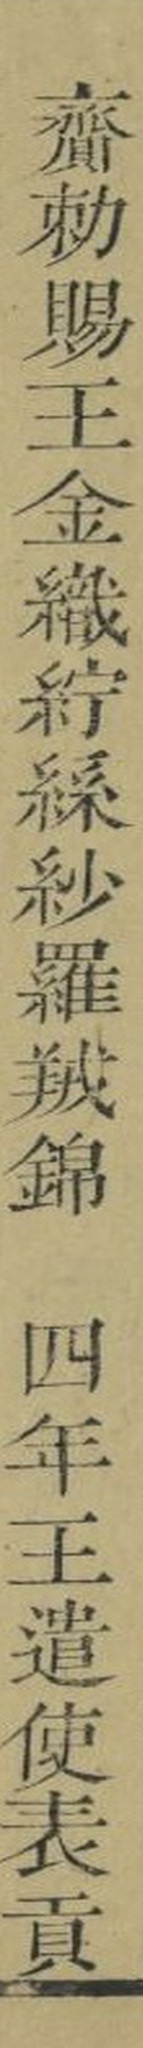齎勅賜王金織紵糸紗羅羢錦四年王遣使表貢
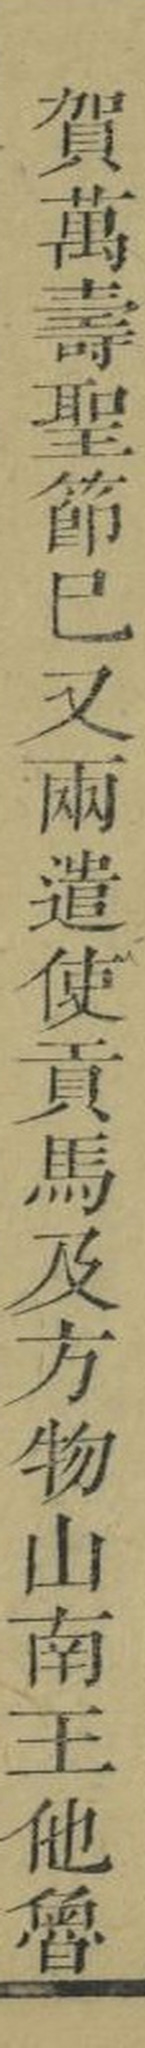賀万寿聖節巳又両遣使貢馬及方物山南王他魯
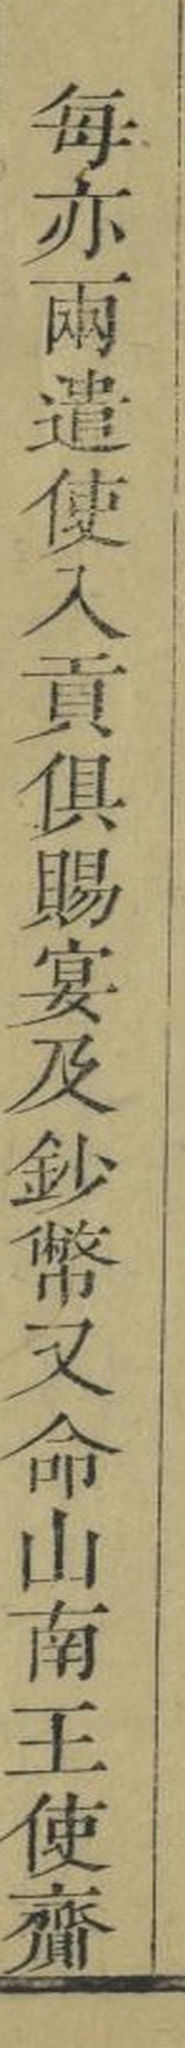毎亦両遣使入貢俱賜宴及鈔幣又命山南王使齎
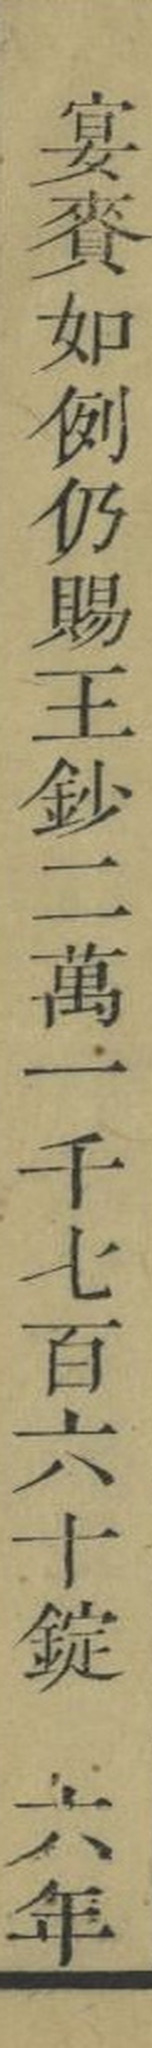宴賚如例仍賜王鈔二万一千七百六十錠六年
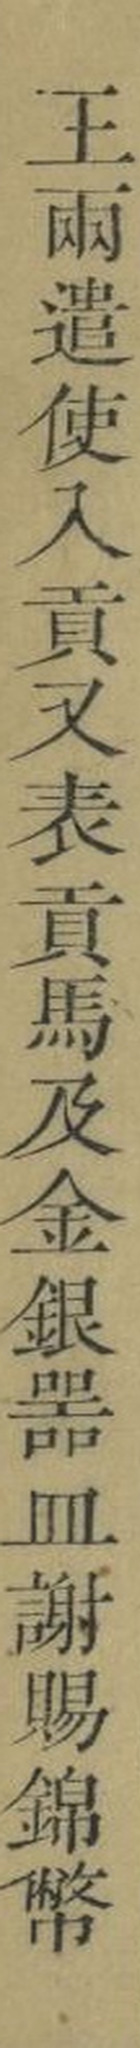王両遣使入貢又表貢馬及金銀器皿謝賜錦幣
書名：中山伝信録 巻三
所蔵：University of the Ryukyus Library
